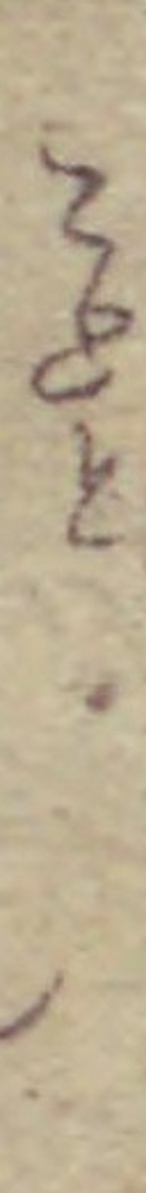ことと
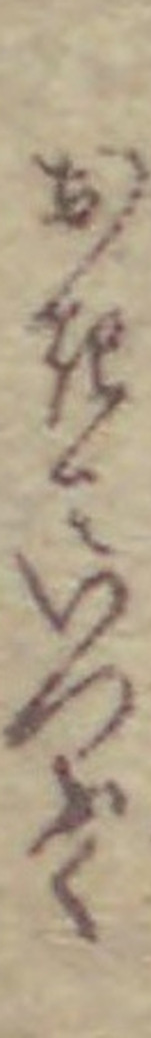おきていつふく
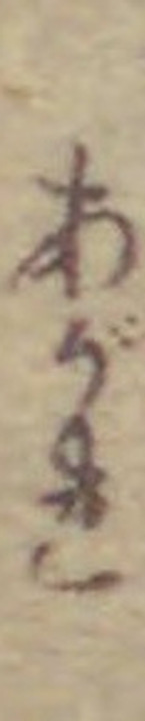あがれ

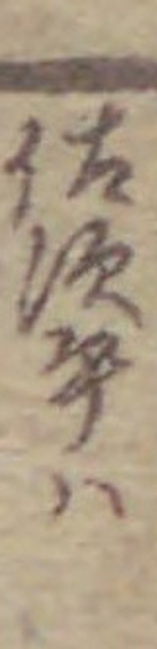佐次平は
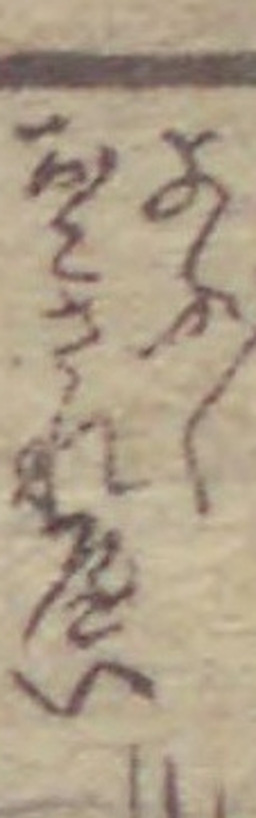おこされへい
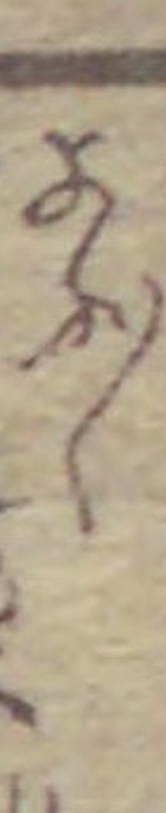よふ〳〵
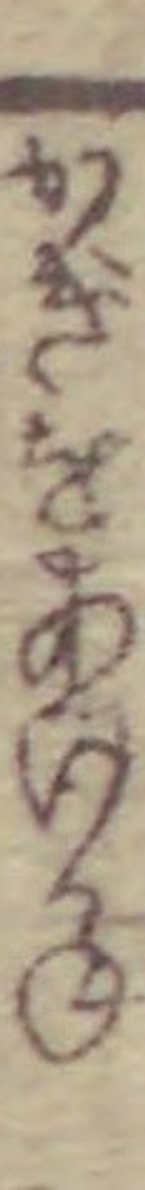かぎをあけかね
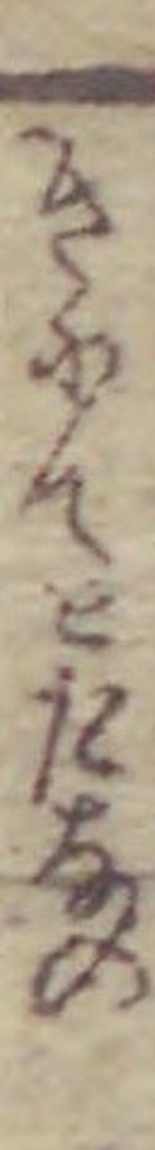きにてとたなの
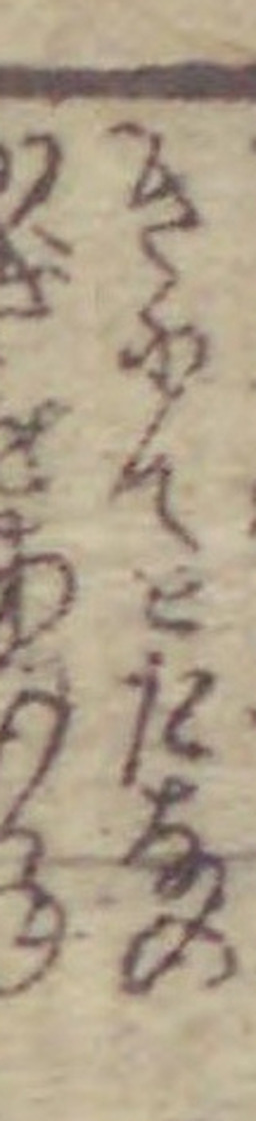かぎをあけかね
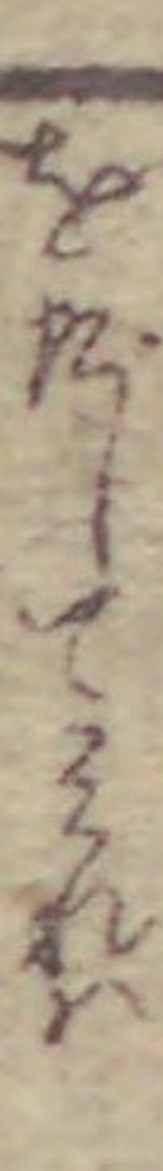をたしてみれは
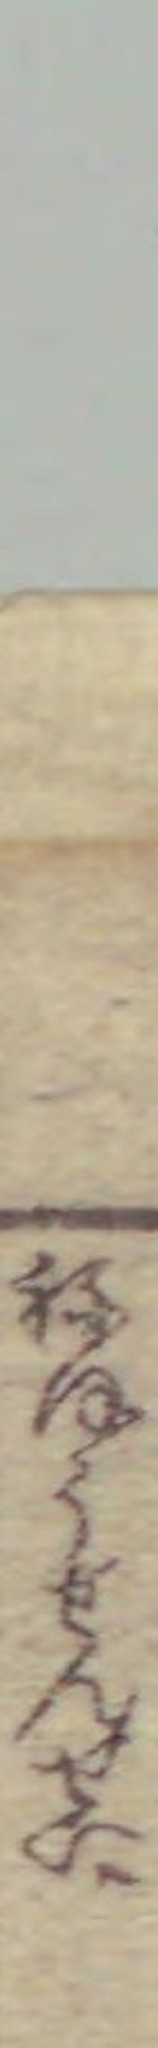ねほうせんせい
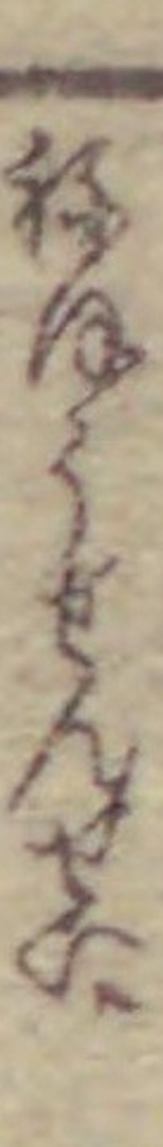ねほうせんせい
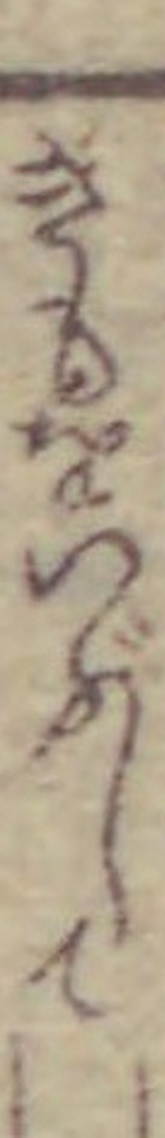きもをつぶして
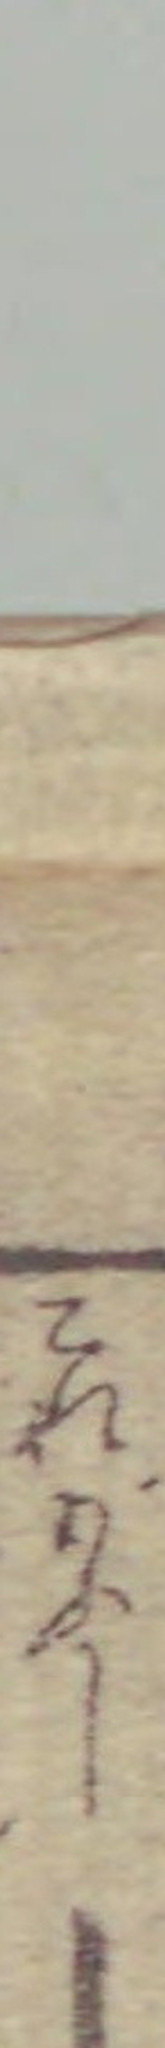これもふし
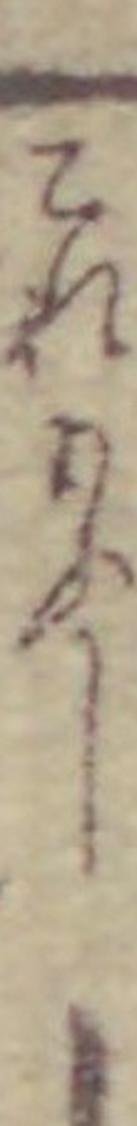これもふし
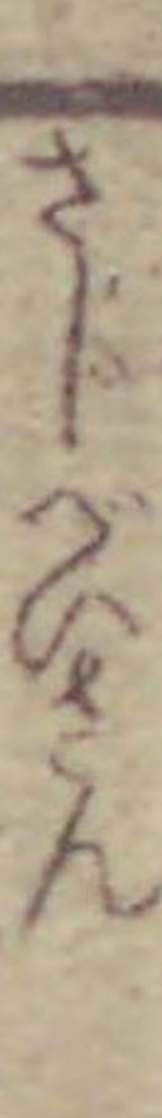さじべいさん
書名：思事夢濃枕 3巻
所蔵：国立国会図書館 National Diet Library, JAPAN
